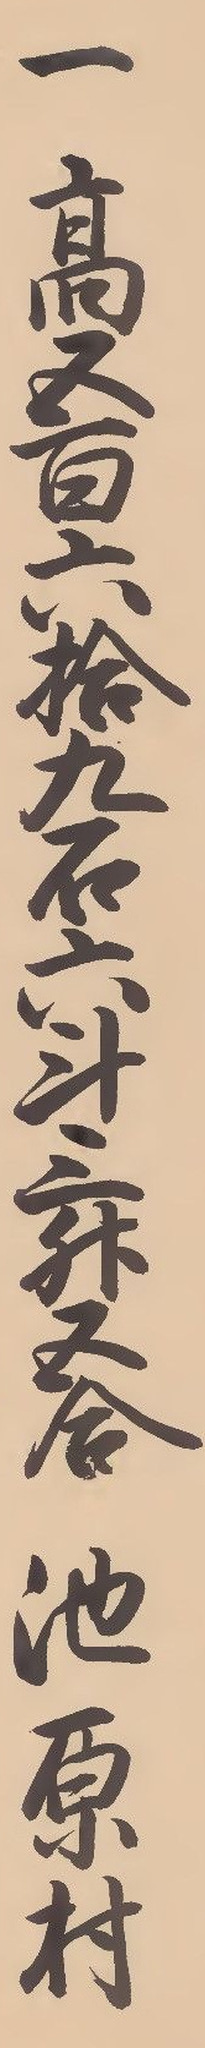一高五百六拾九石六斗三升五合池原村
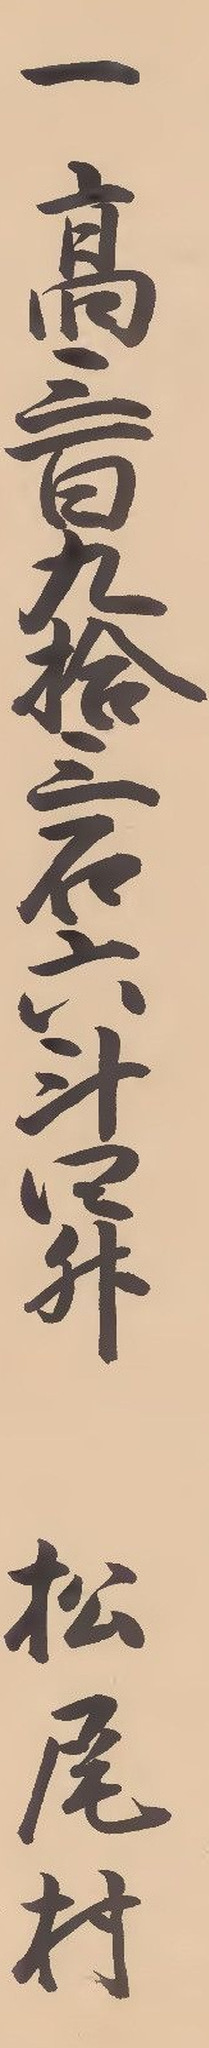一高三百九拾三石六斗四升松尾村
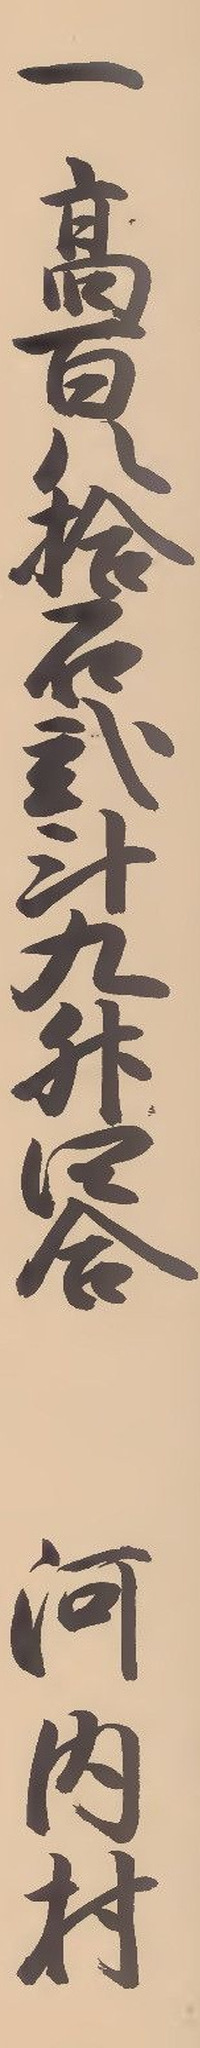一高百八拾石弐斗九升四合河内村
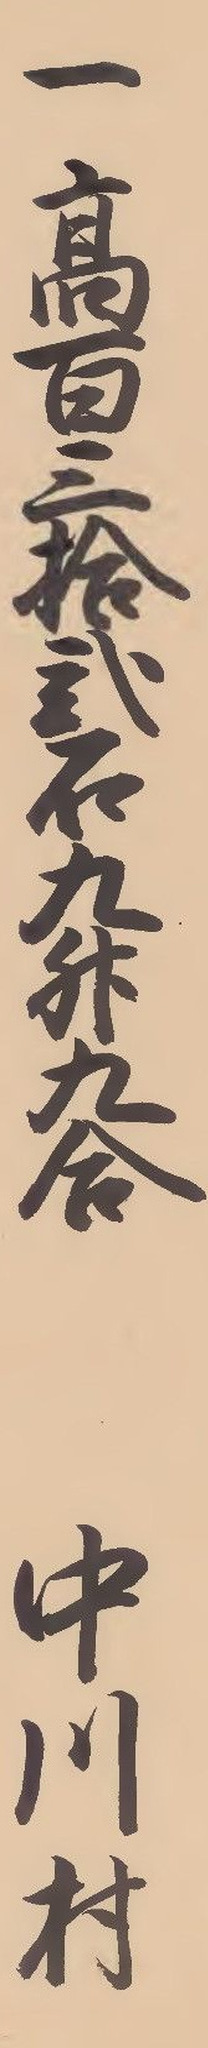一高百三拾弐石九升九合中川村
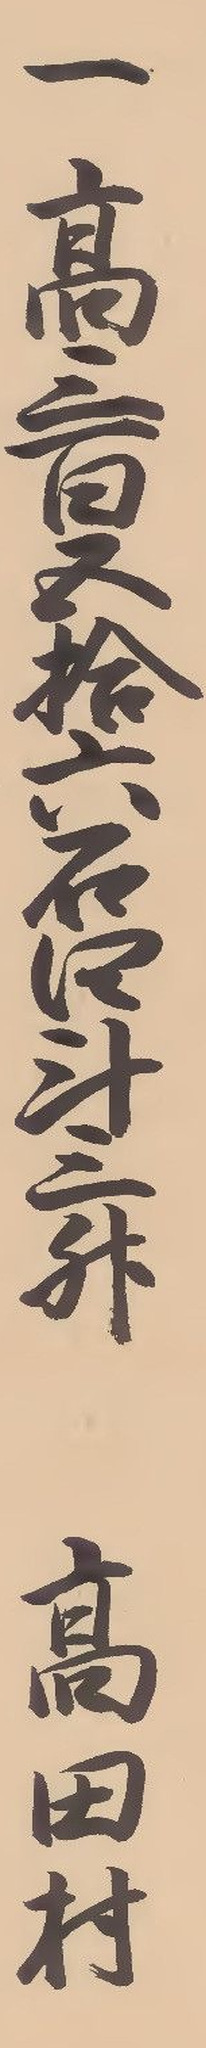一高三百五拾六石四斗三升高田村
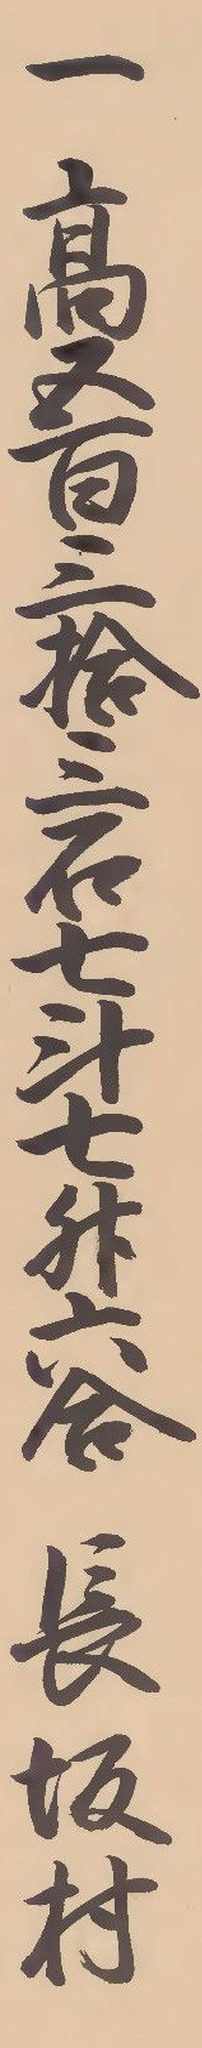一高五百三拾三石七斗七升六合長坂村

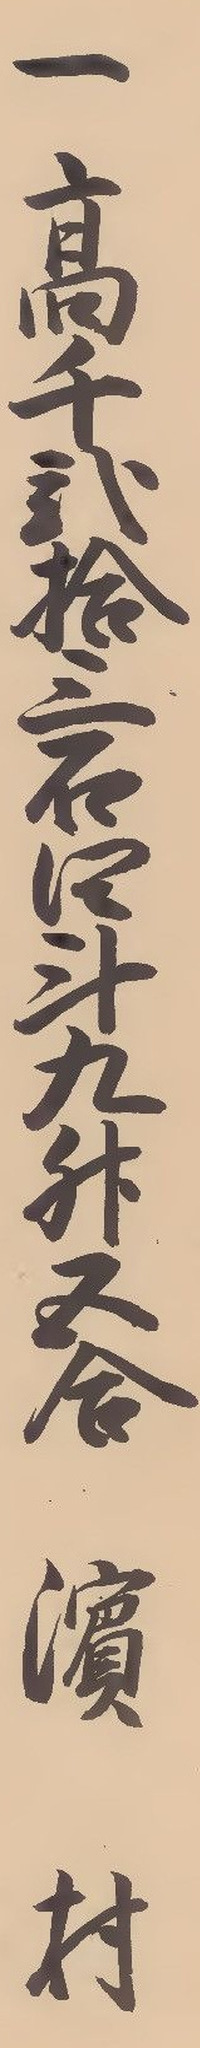一高千弐拾三石四斗九升五合浜村
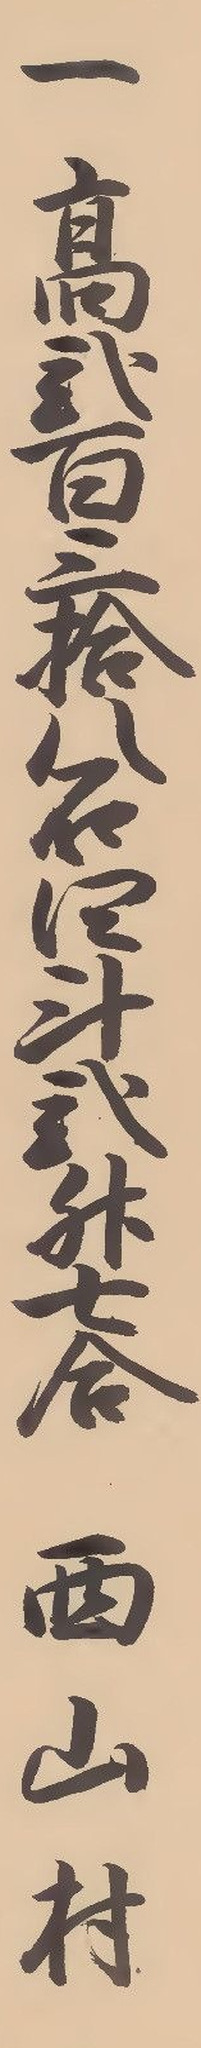一高弐百三拾八石四斗弐升七合西山村
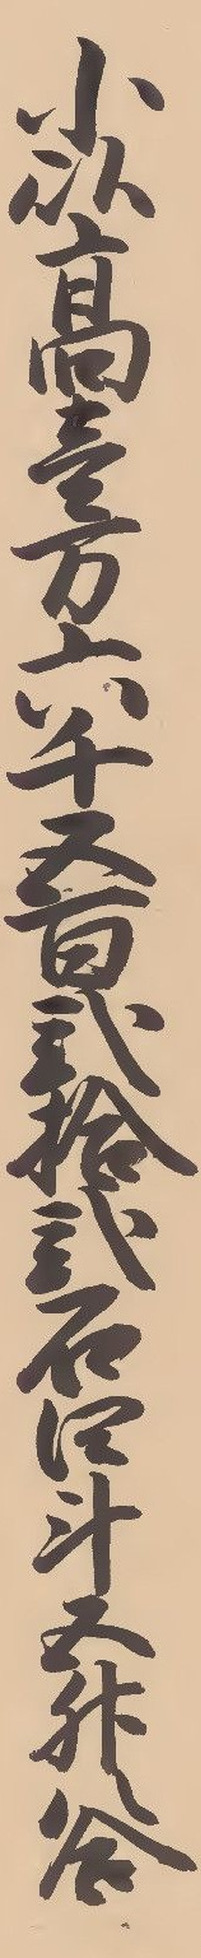小以高壱万六千五百弐拾弐石四斗五升八合

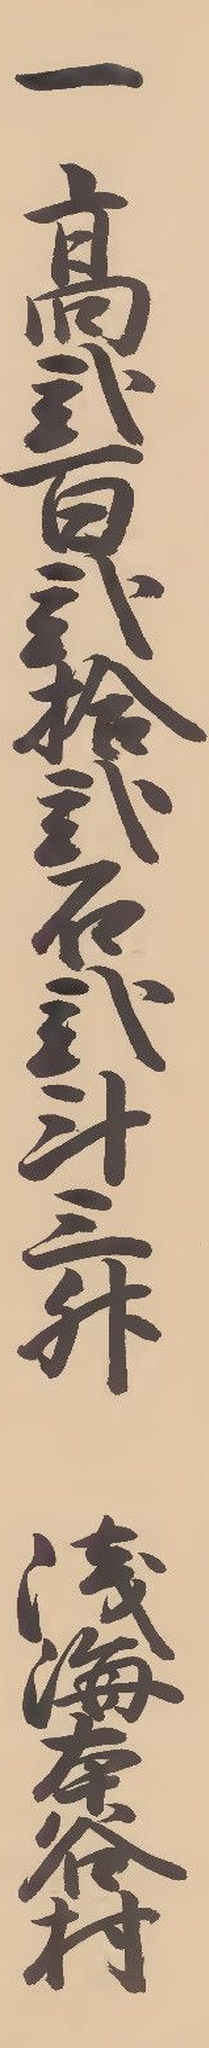一高弐百弐拾弐石弐斗三升浅海本谷村
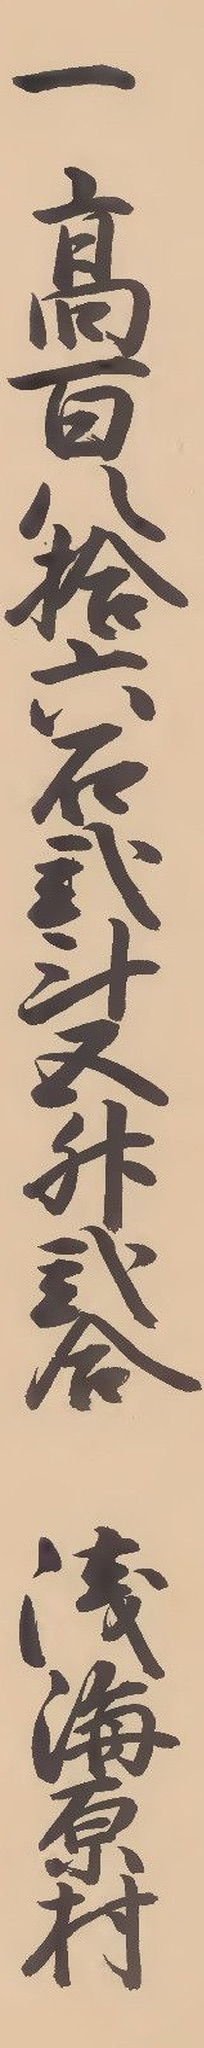一高百八拾六石弐斗五升弐合浅海原村
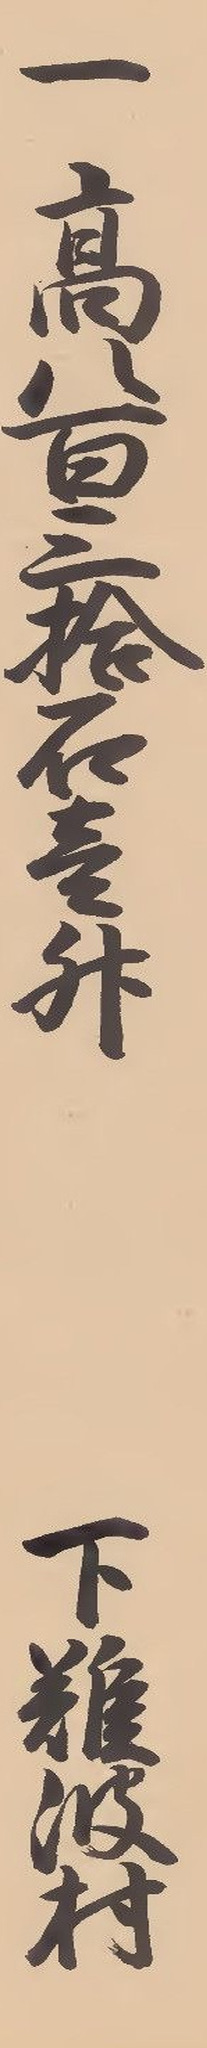一高八百三拾石壱升下難波村
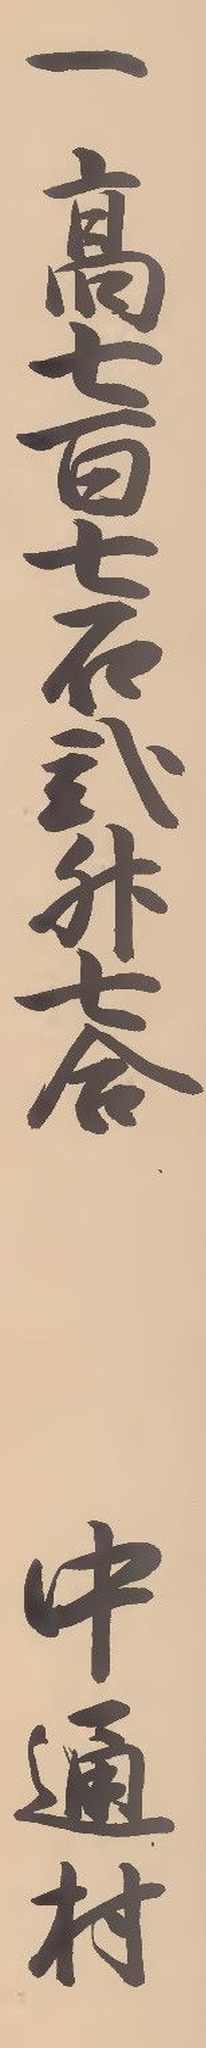一高七百七石弐升七合中通村
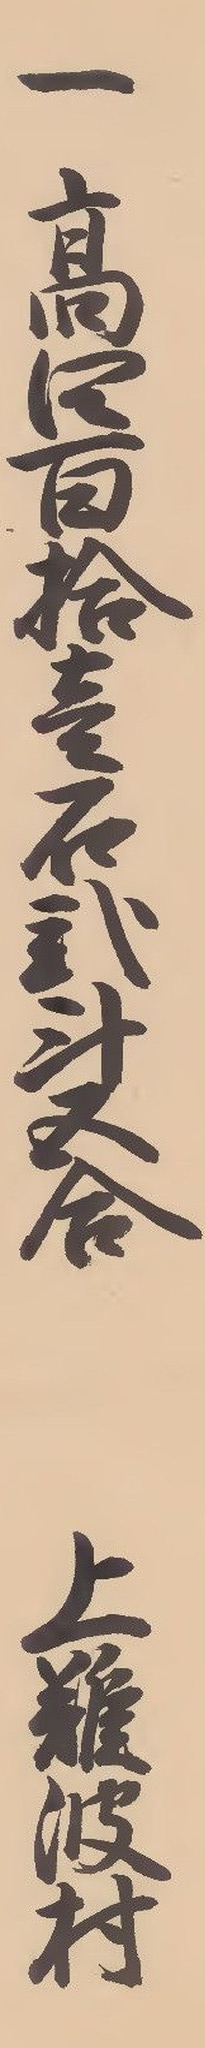一高四百拾壱石弐斗五合上難波村
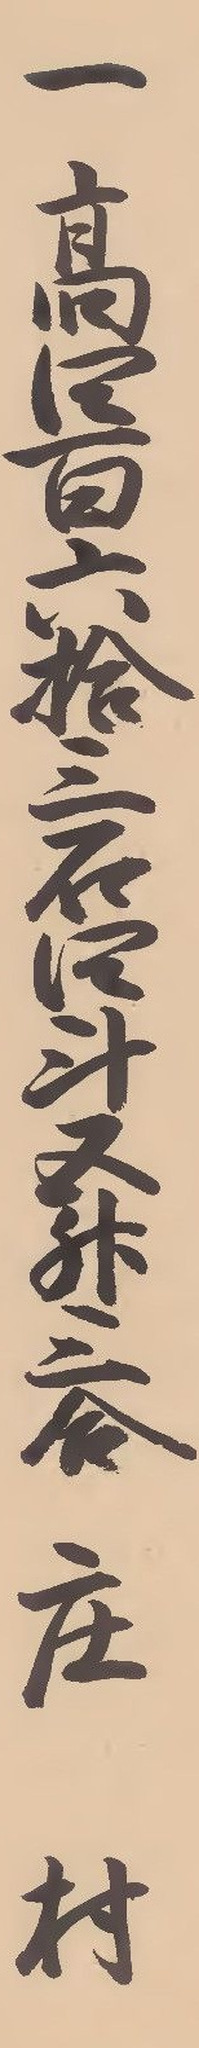一高四百六拾三石四斗五升三合庄村
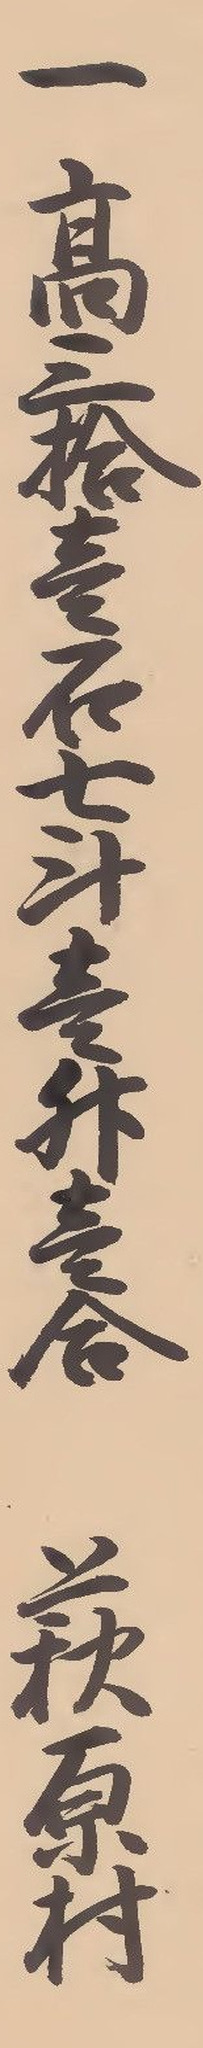一高三拾壱石七斗壱升壱合萩原村
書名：伊予国郷帳
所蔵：国立公文書館 National Archives of Japan
